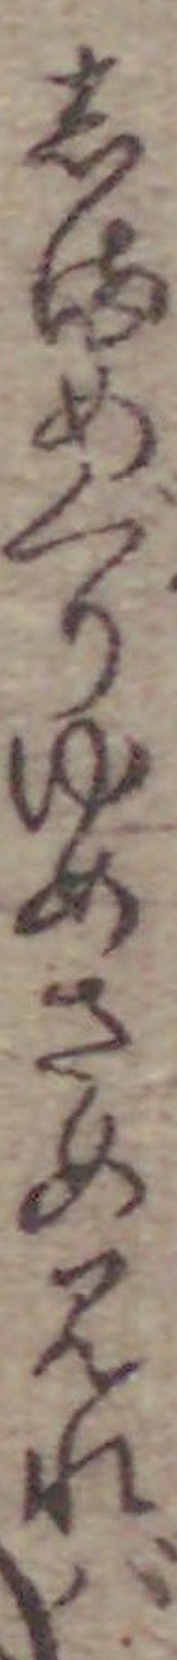しまめぐりゆめさめ見れば
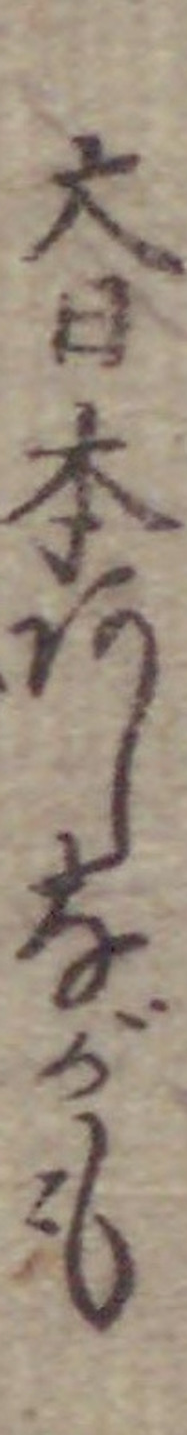大日本あしながも
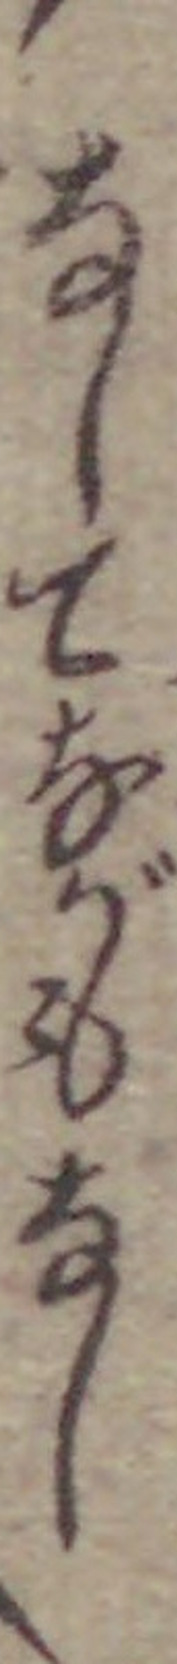なしてながもなし
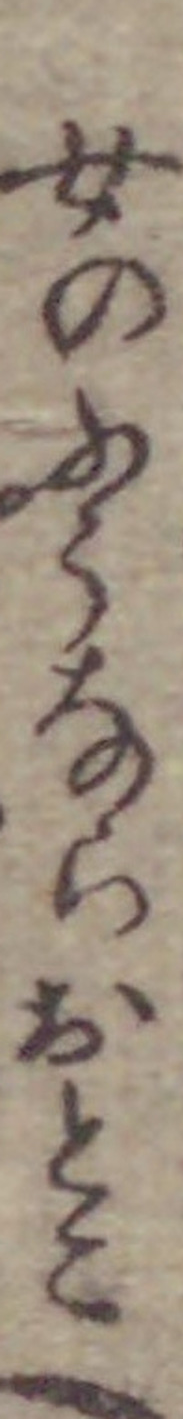女のふうならおとこ
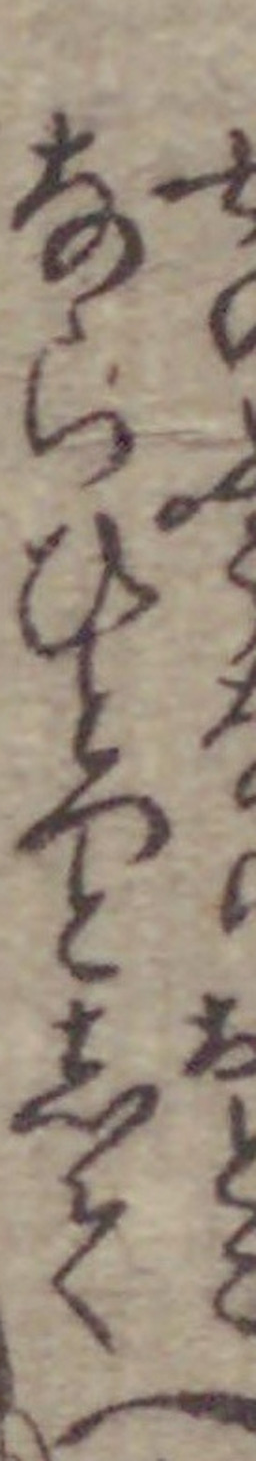ならひとつとして
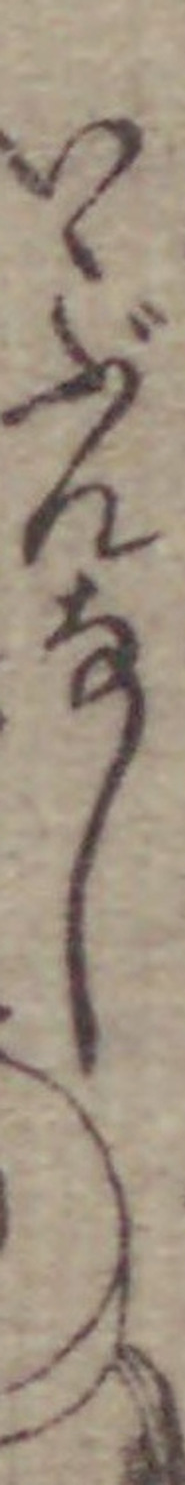いゝぶんなし
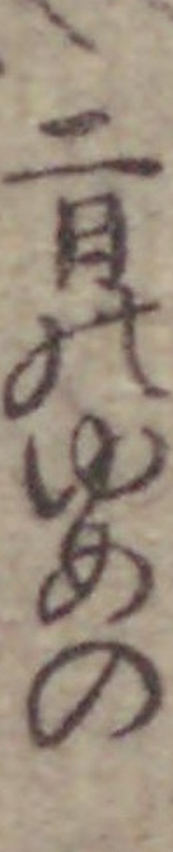二日のゆめの
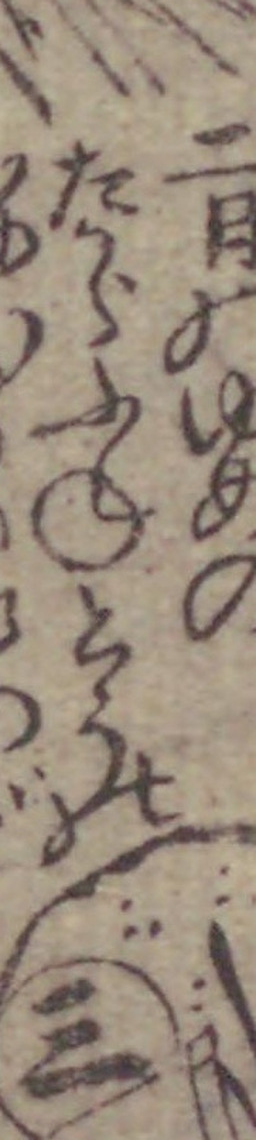たからふねとうの
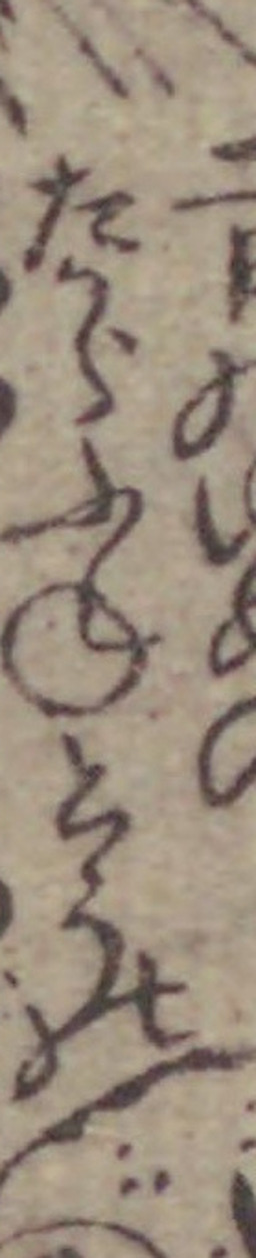たからふねとうの
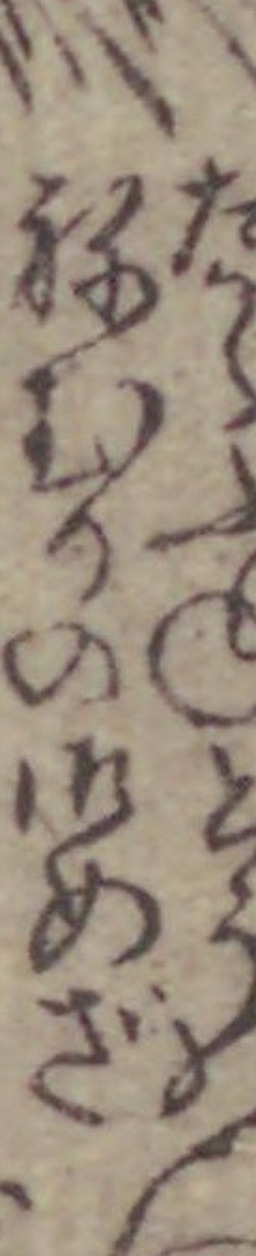ねむりの御めざ
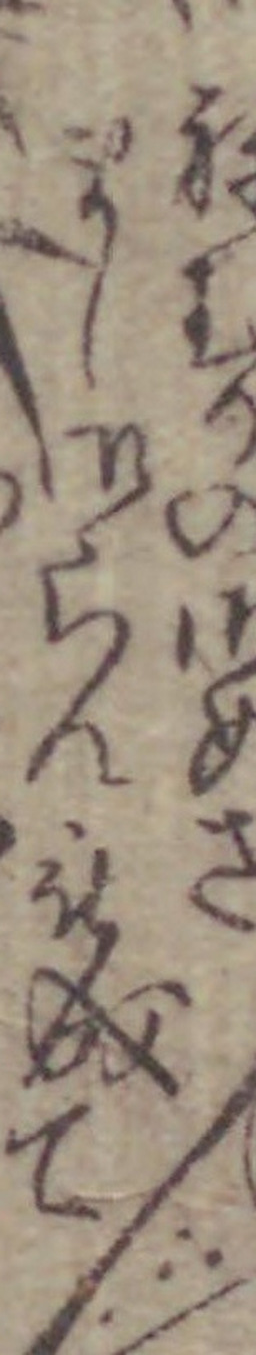まし御らん被成て
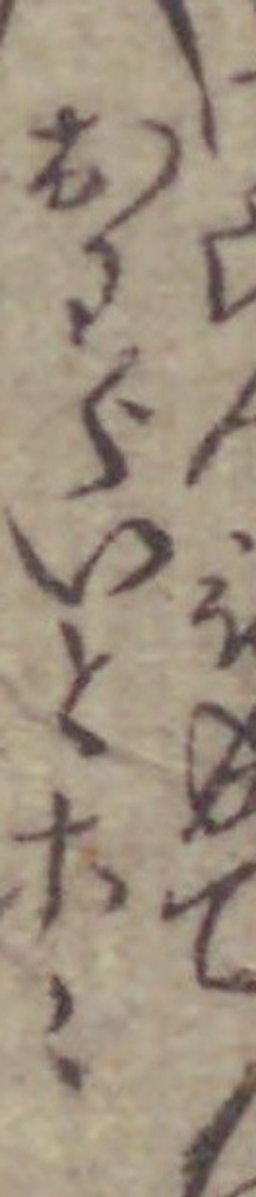おわらいとホ〻
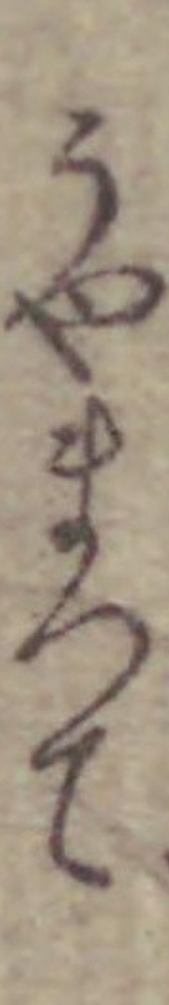うやまつて
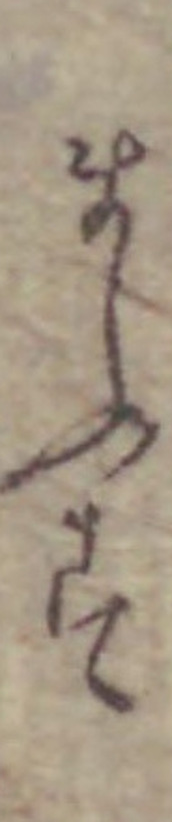まふす
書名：近頃嶋めぐり 3巻
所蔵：国立国会図書館 National Diet Library, JAPAN
